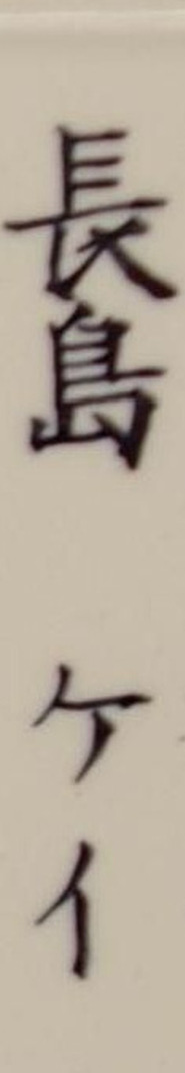長島ケイ
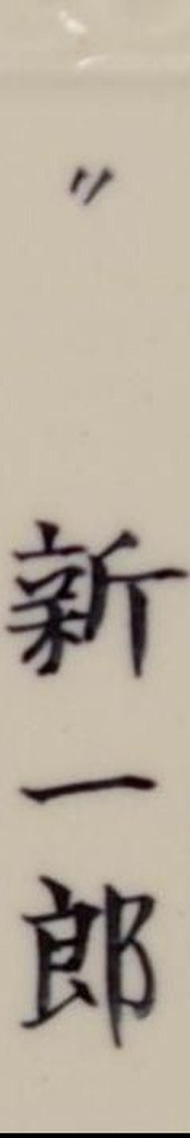新一郎
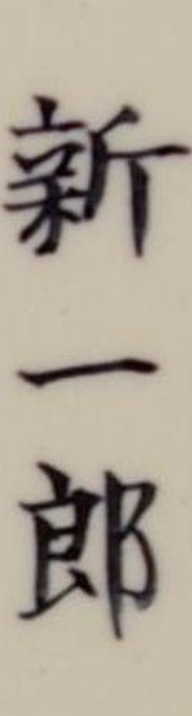新一郎
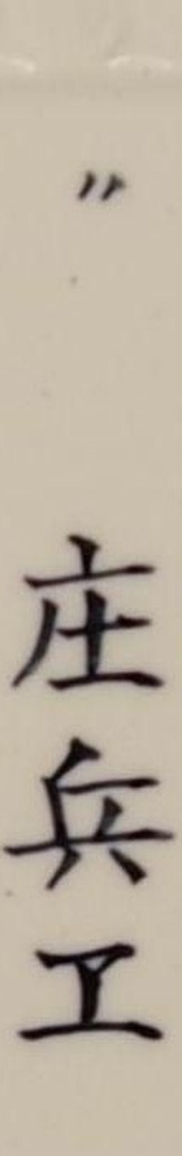庄兵エ
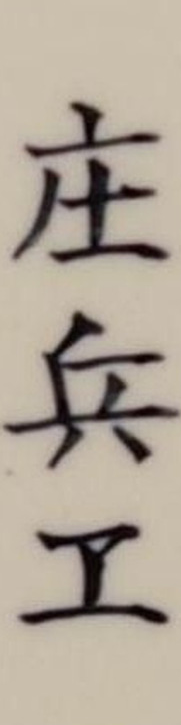庄兵エ
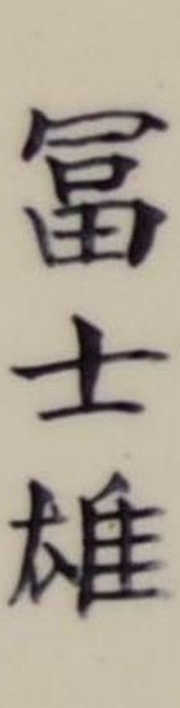冨士雄
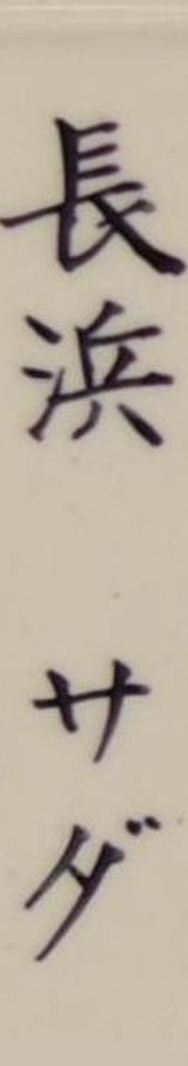長浜サダ

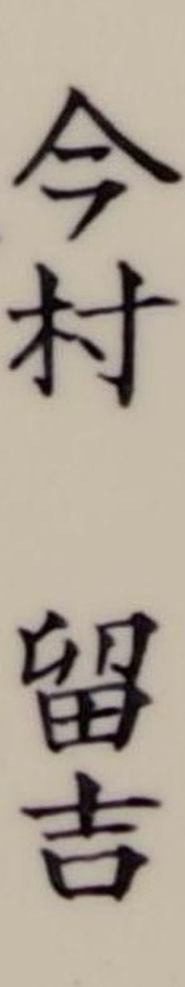今村留吉
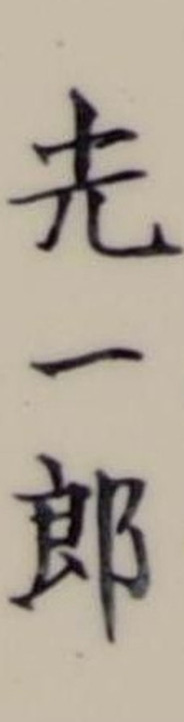光一郎
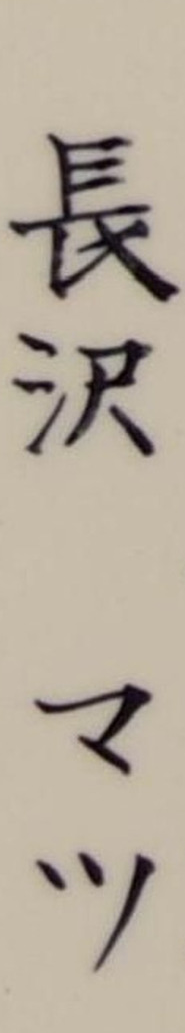長沢マツ

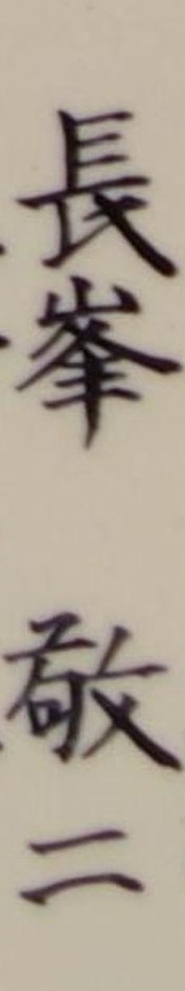長峯敬二
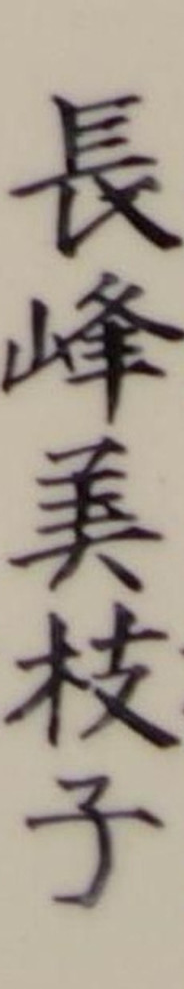長峰美枝子
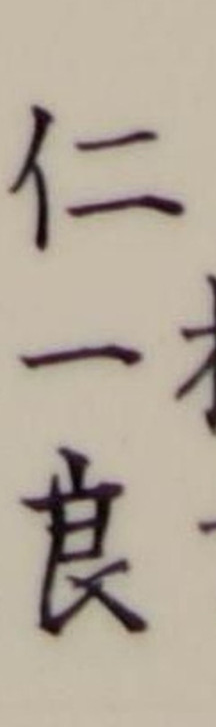仁一良
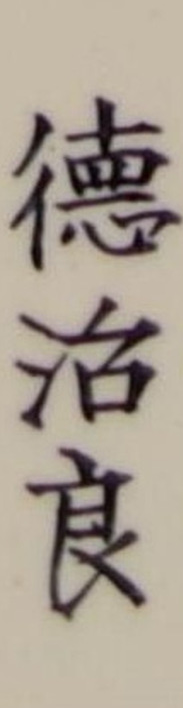徳治良
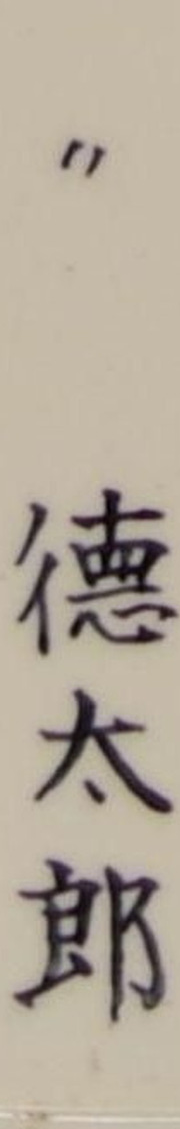徳太郎
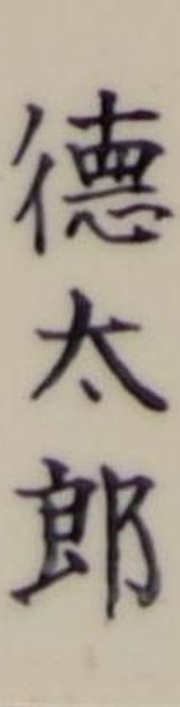徳太郎
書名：M~S
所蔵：高野山金剛峯寺
